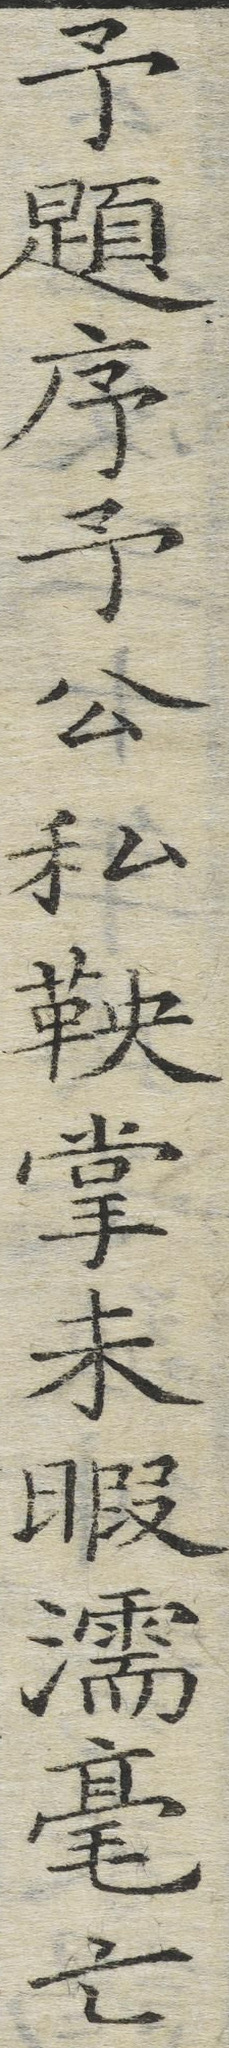予題序予公私鞅掌未暇濡毫亡
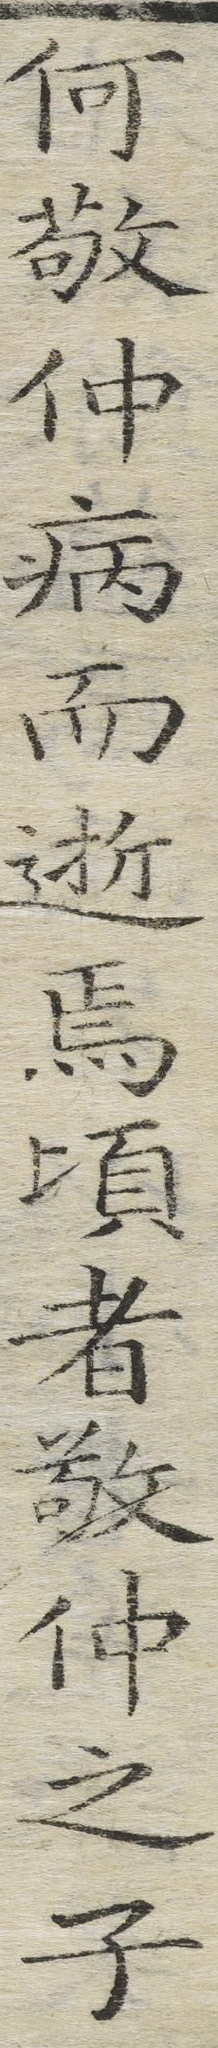何敬仲病而逝焉頃者敬仲之子
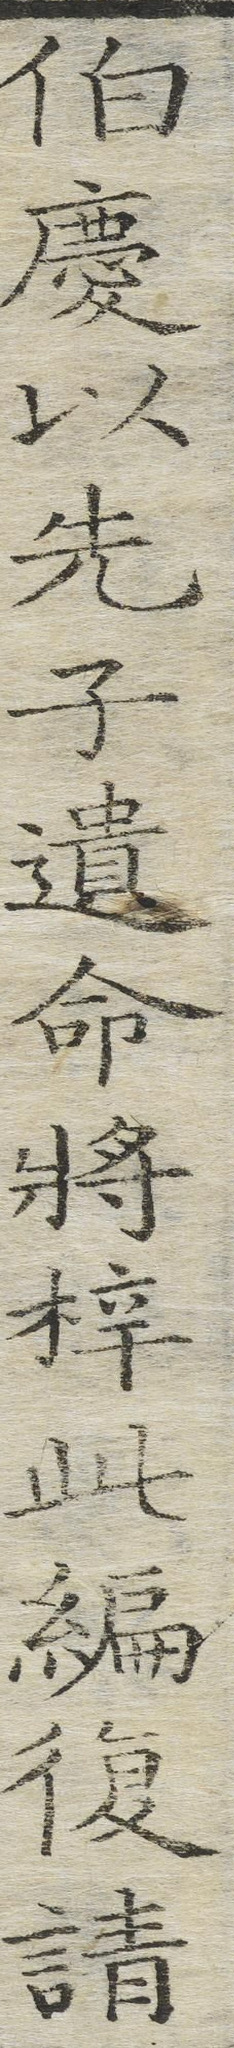伯慶以先子遺命将梓此編復請
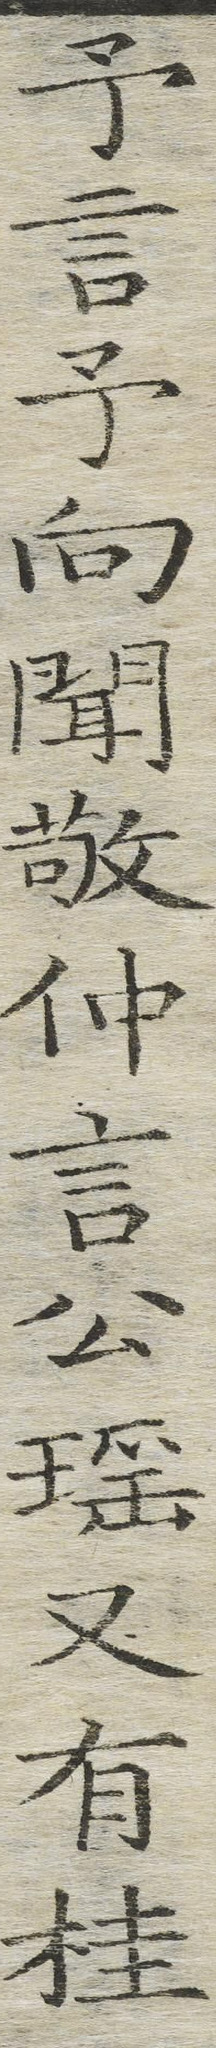予言予向聞敬仲言公瑶又有桂
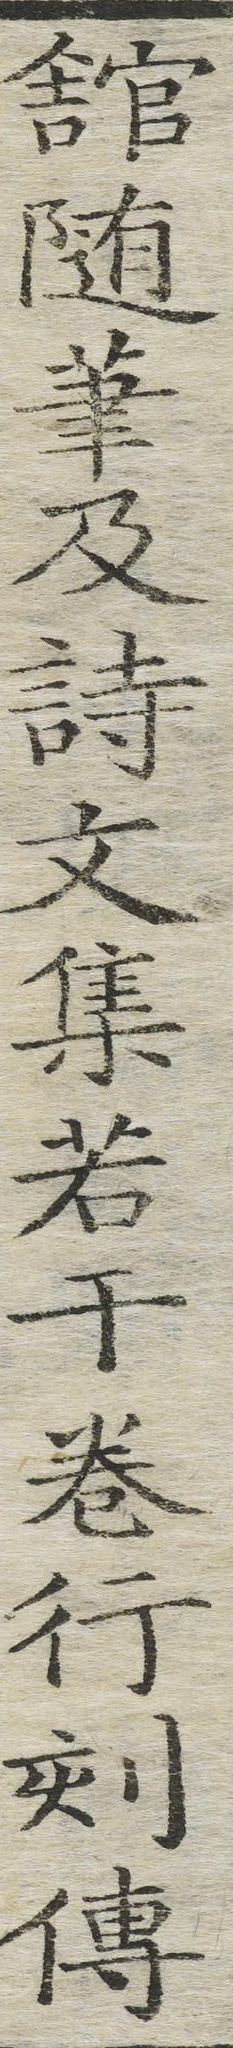館随筆及詩文集若干巻行刻伝
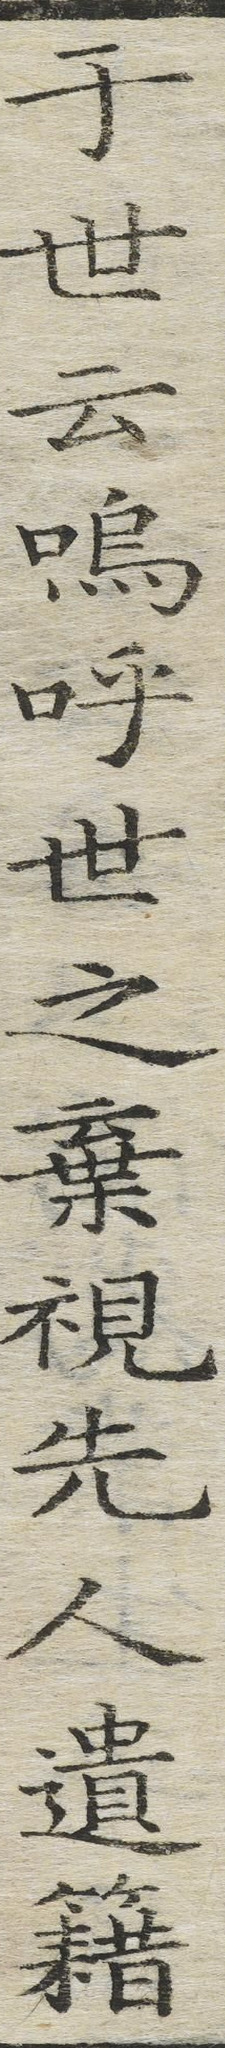于世云鳴呼世之棄視先人遺籍
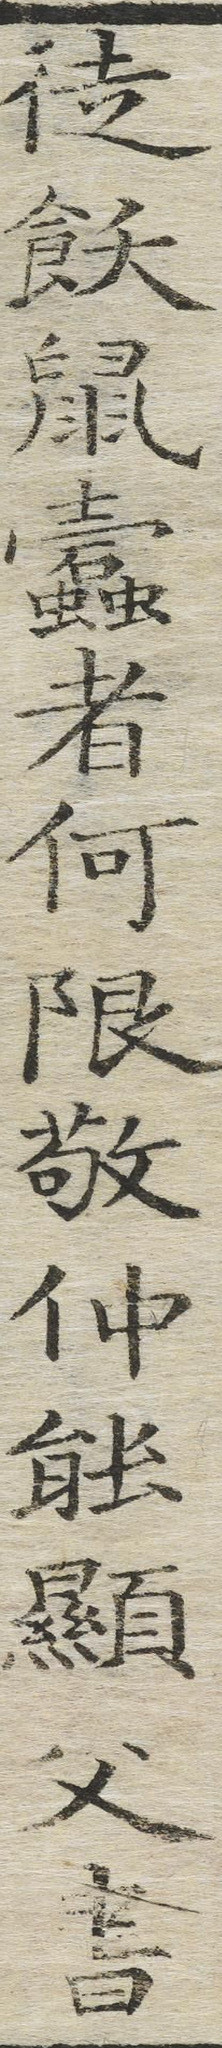徒飫鼠蠹者何限敬仲能顕父書
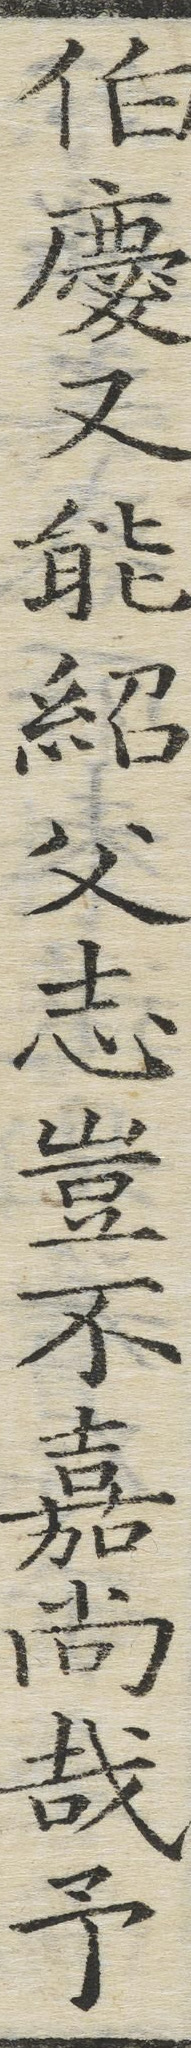伯慶又能紹父志豈不嘉尚哉予
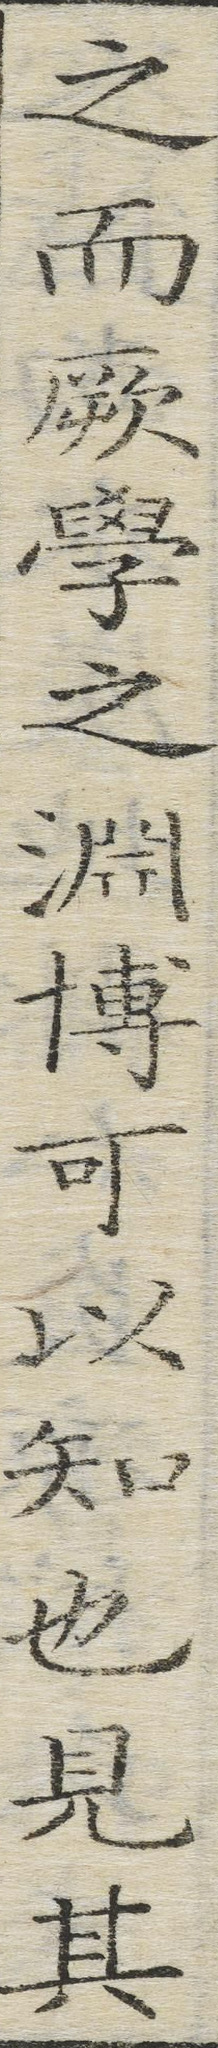之而厥学之淵博可以知也見其
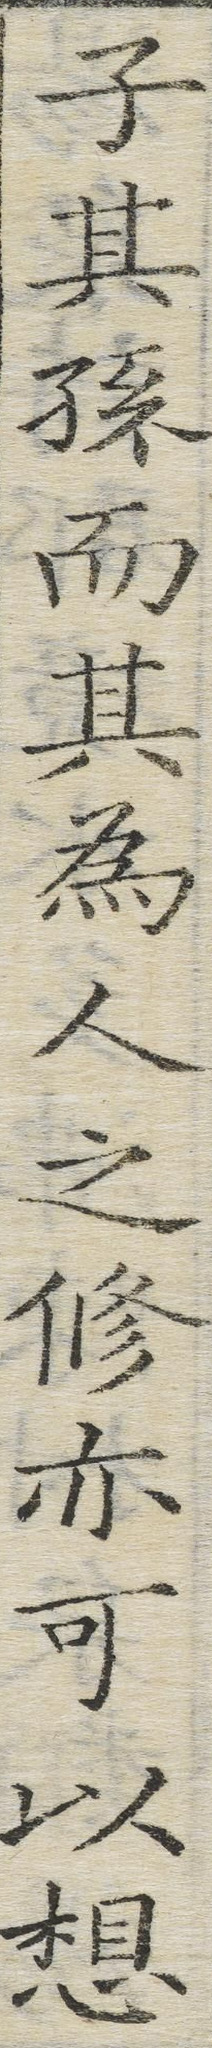子其孫而其為人之修亦可以想
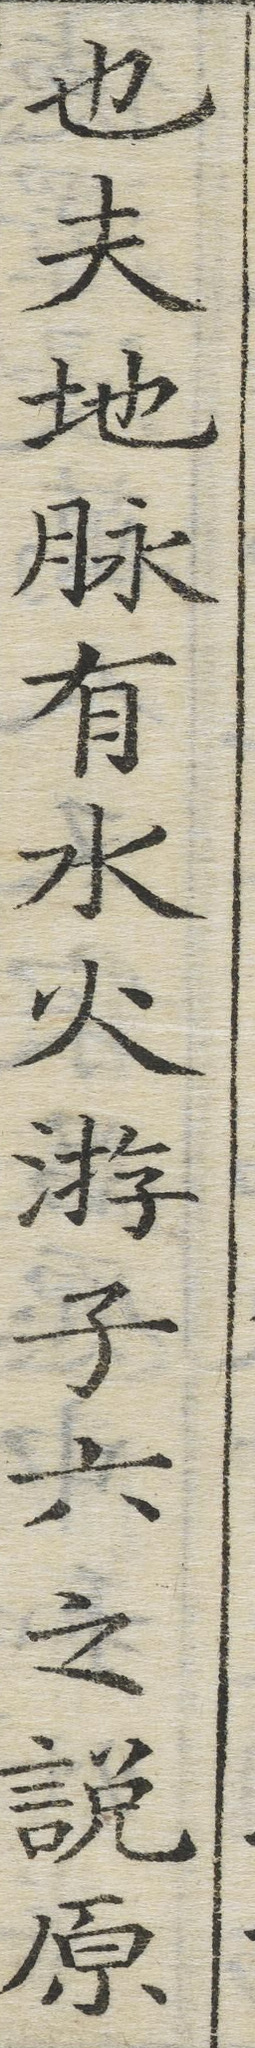也夫地脉有水火游子六之説原
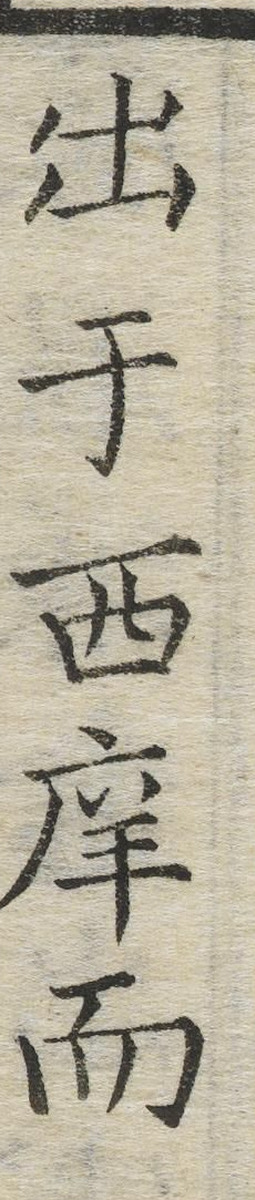出于西庠而
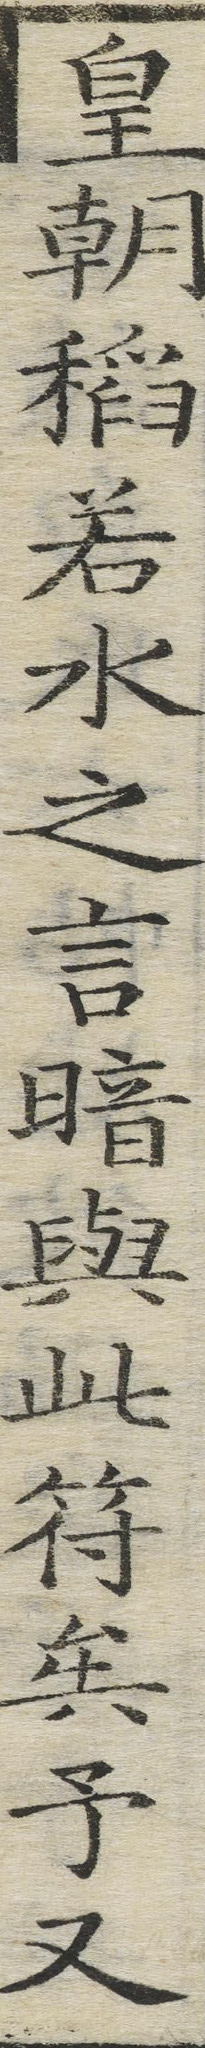皇朝稲若水之言暗与此符矣予又

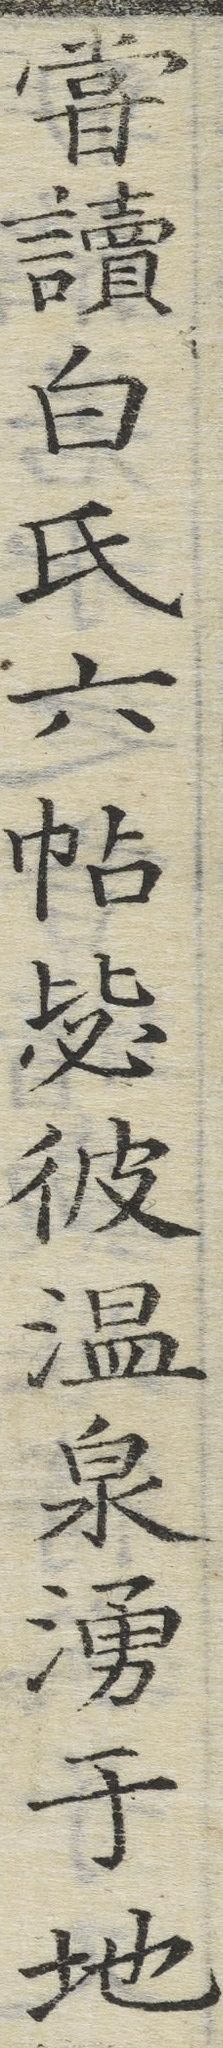嘗讀白氏六帖毖彼溫泉湧于地
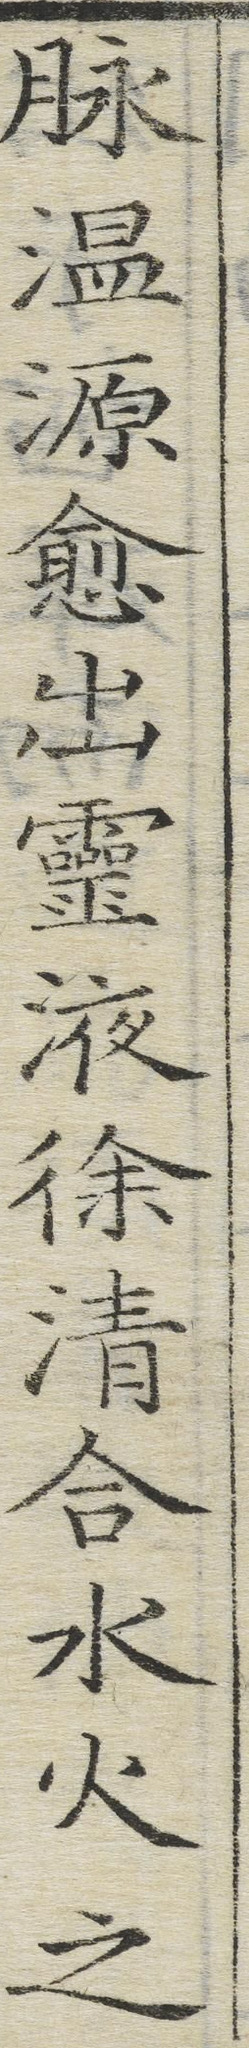脉溫源愈出靈液徐清合水火之
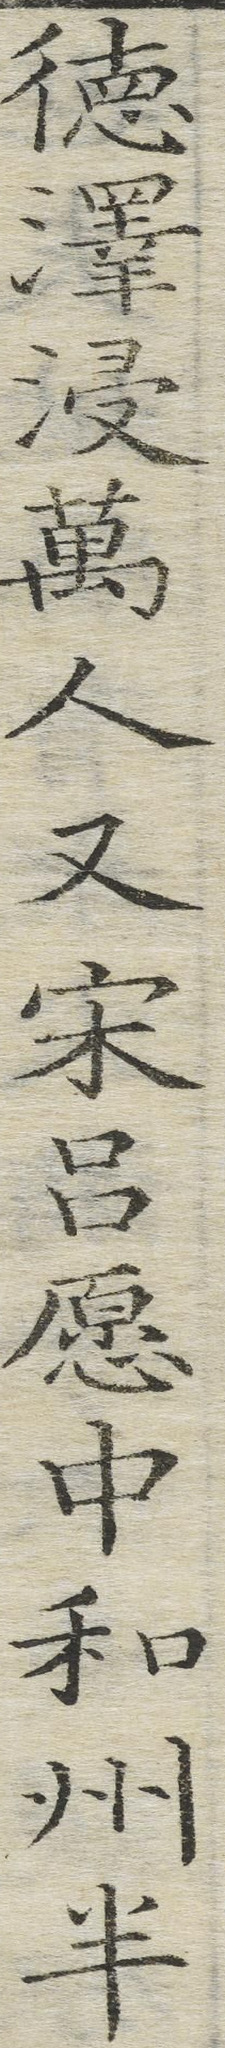德澤浸萬人又宋呂愿中和州半
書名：温泉考
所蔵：東京大学地震研究所図書室 Earthquake Research Institute Library, The University of Tokyo, JAPAN
